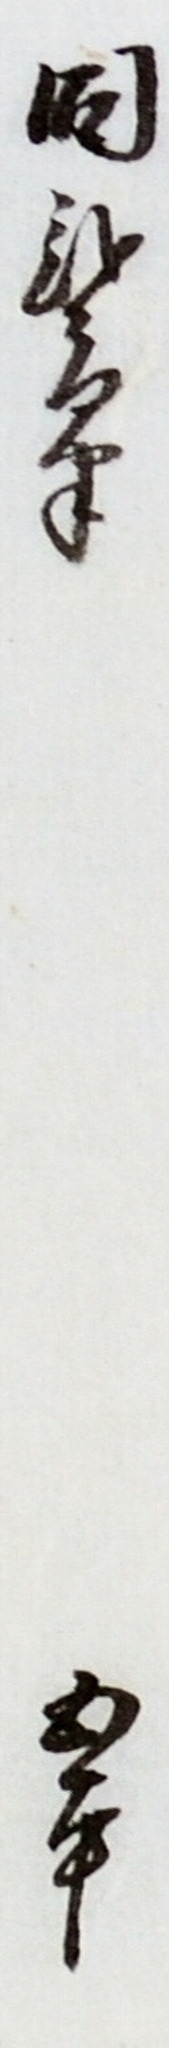同弐間半五本
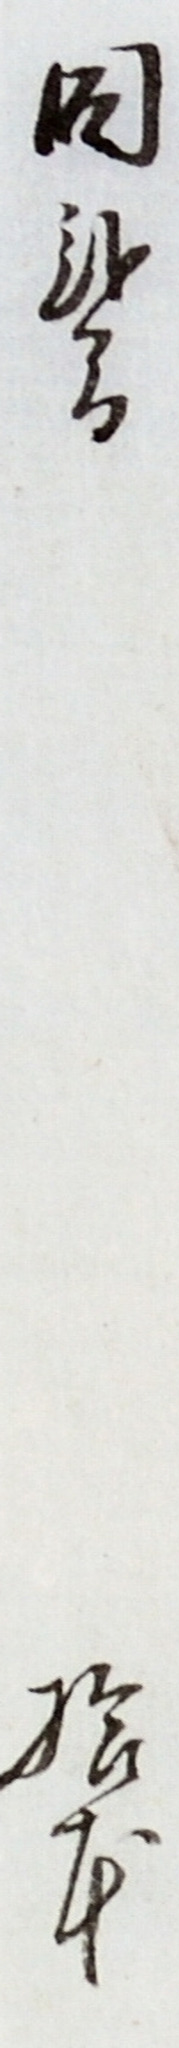同弐間拾本
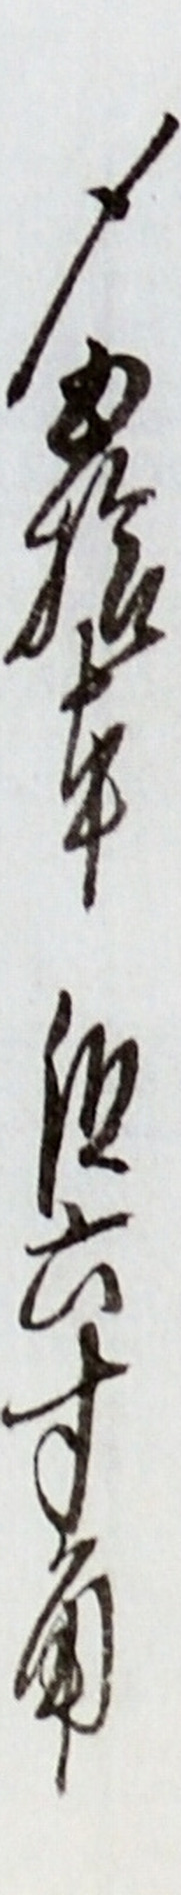〆五拾本但六寸角
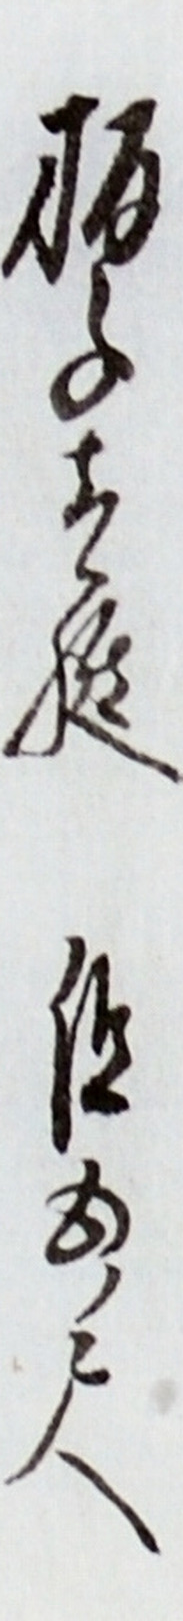板子壱挺但五ノ尺

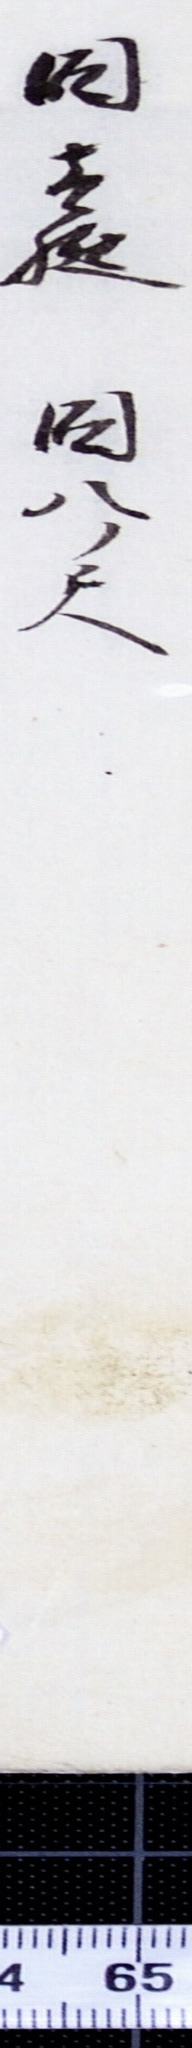同壱挺同八ノ尺
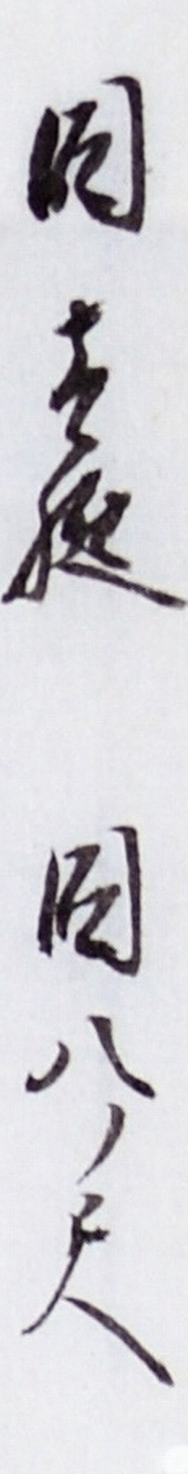同壱挺同八ノ尺
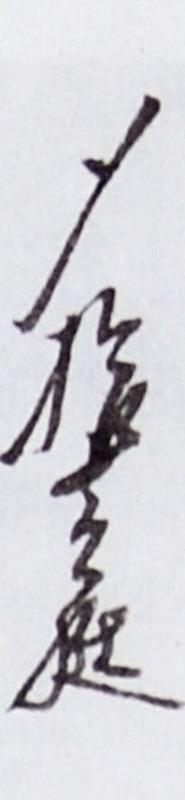〆拾壱疋
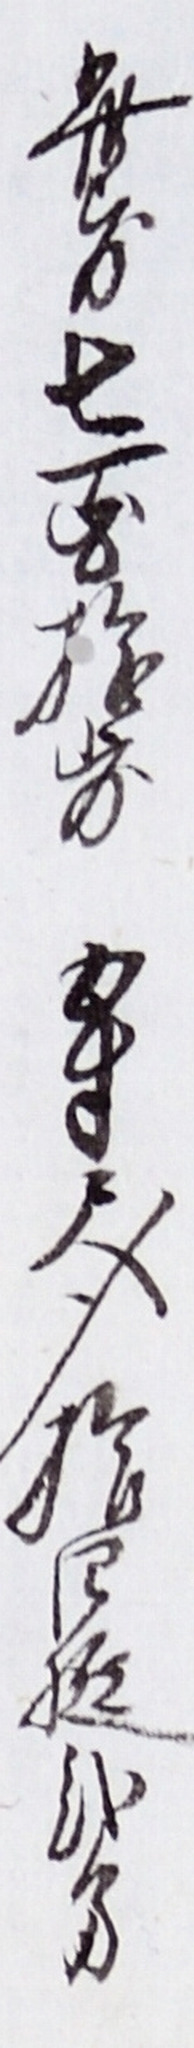此方七拾歩五寸尺〆拾四挺弐分
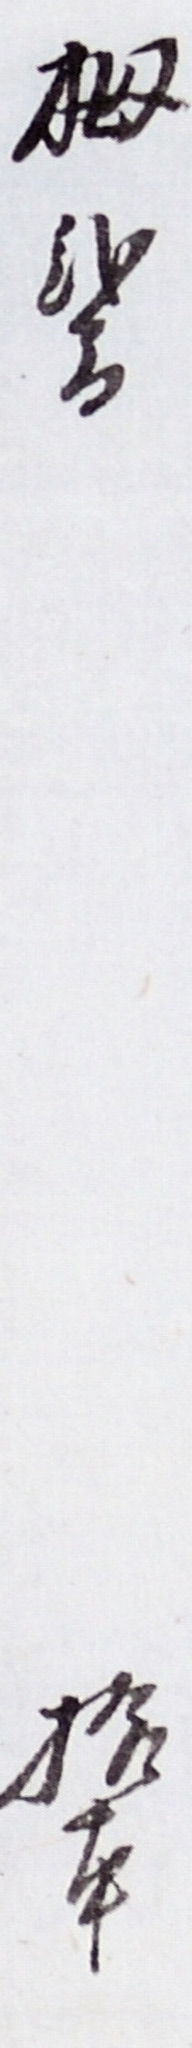栂弐間拾本
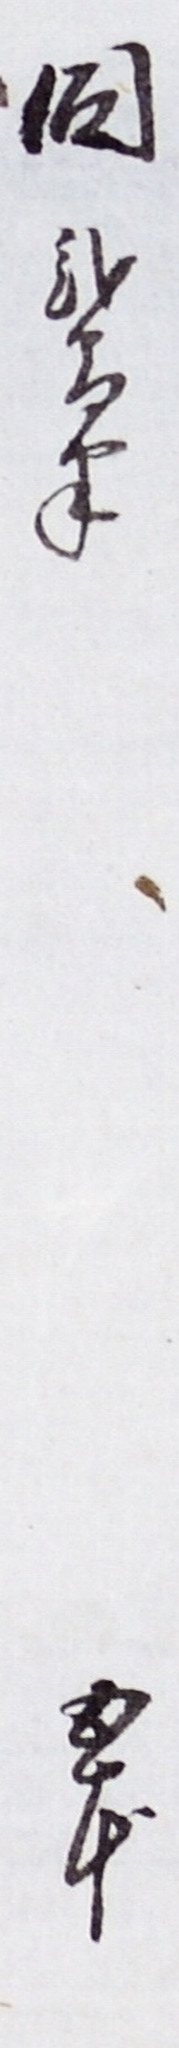同三間五本
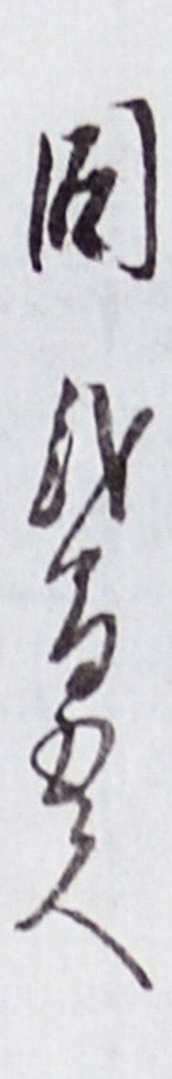同三間五本
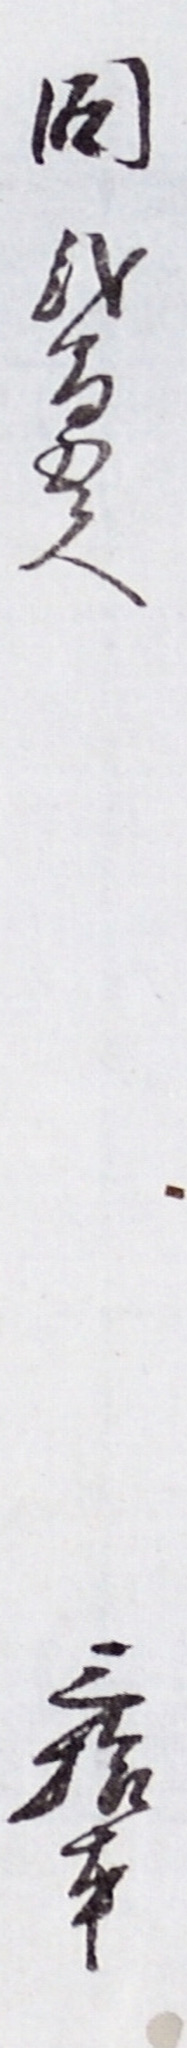同弐間五尺三拾本
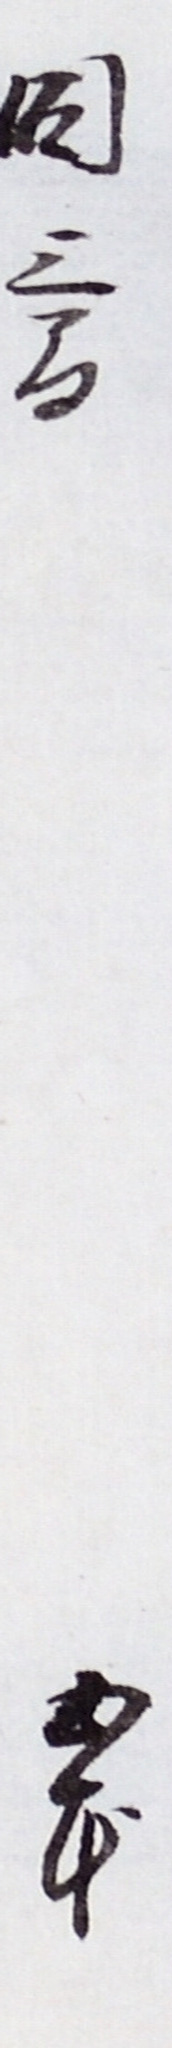同三間五本
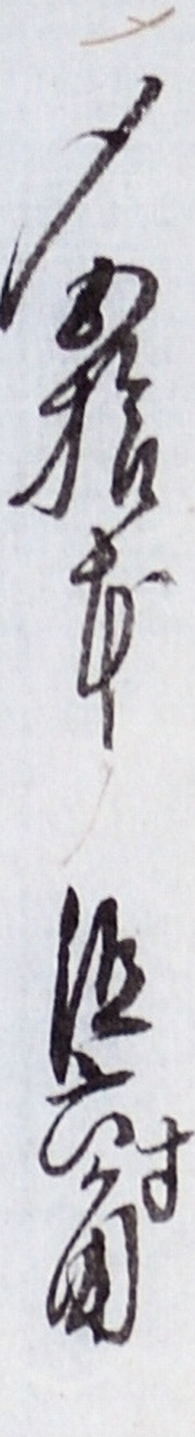〆五拾本組六寸角
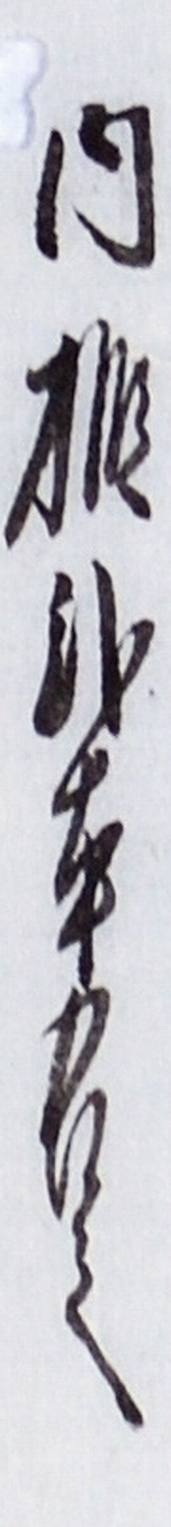内棚弐本右之
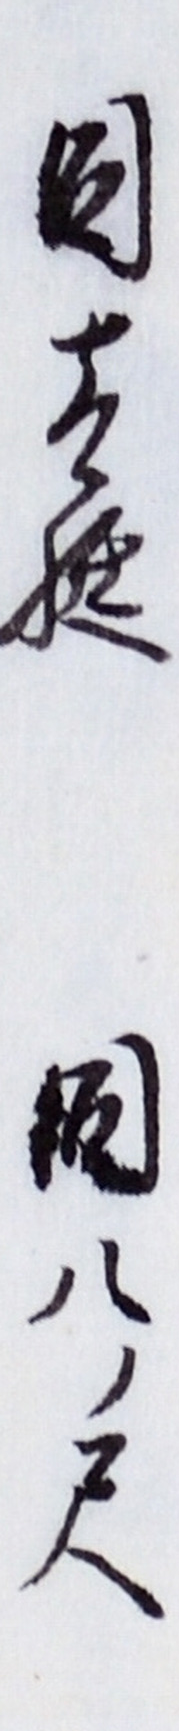同壱挺同八ノ尺
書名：御山奉行御用控
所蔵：伊那市立高遠町図書館・合同会社AMANE
